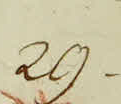29
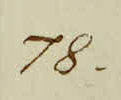78
